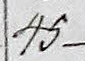45
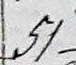51
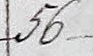56
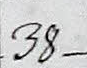38
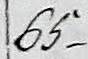65
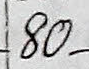80
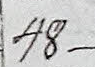48
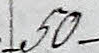50
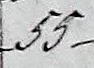55
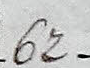62
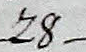28
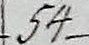54
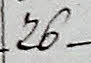26
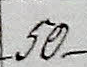50
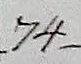74
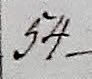54
